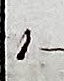1
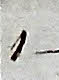1
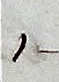1
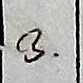3.
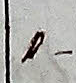1
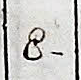8
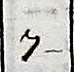7
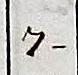7
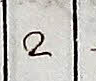2
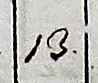13.
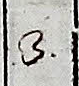3.
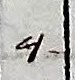4
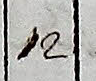12
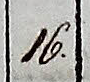16.
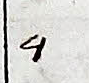4
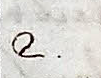2.
